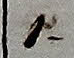1
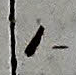1
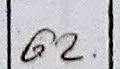62.
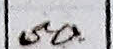50.
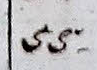55
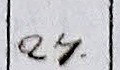27.
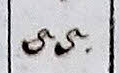55.
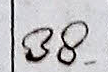38
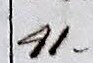41
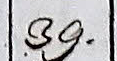39.
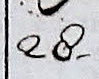28
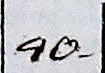40
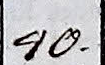40
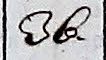36.
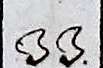33.
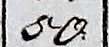50.
